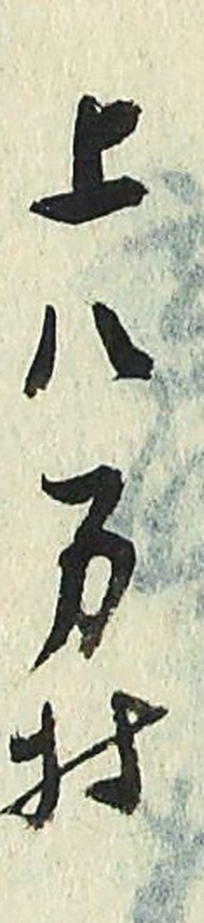上八万村
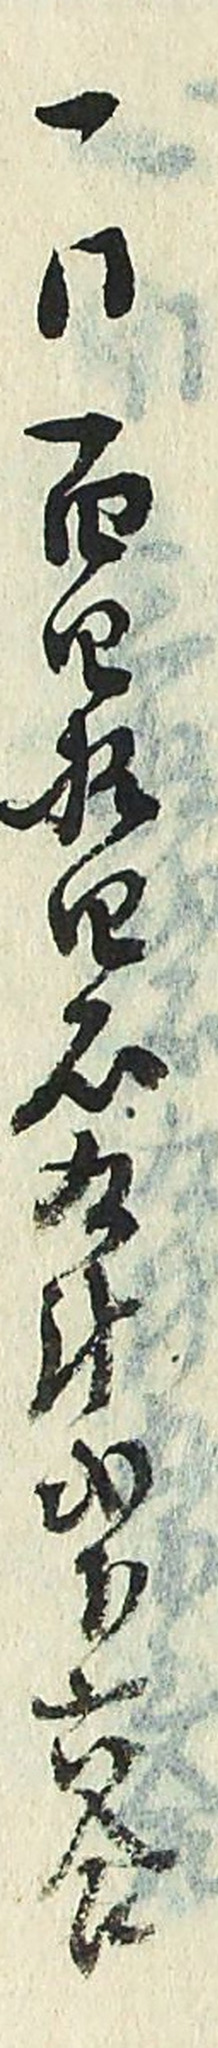一同百四拾四石九斗弐升六合
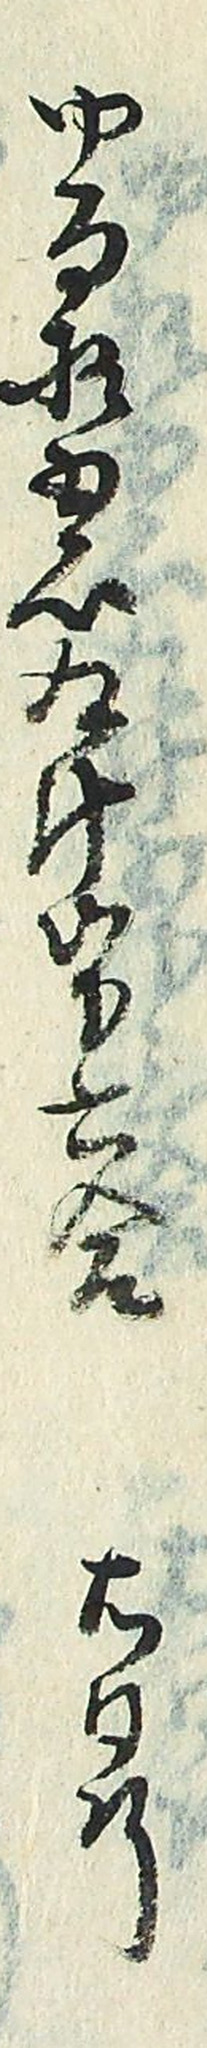内百拾五石九斗弐升六合右同断
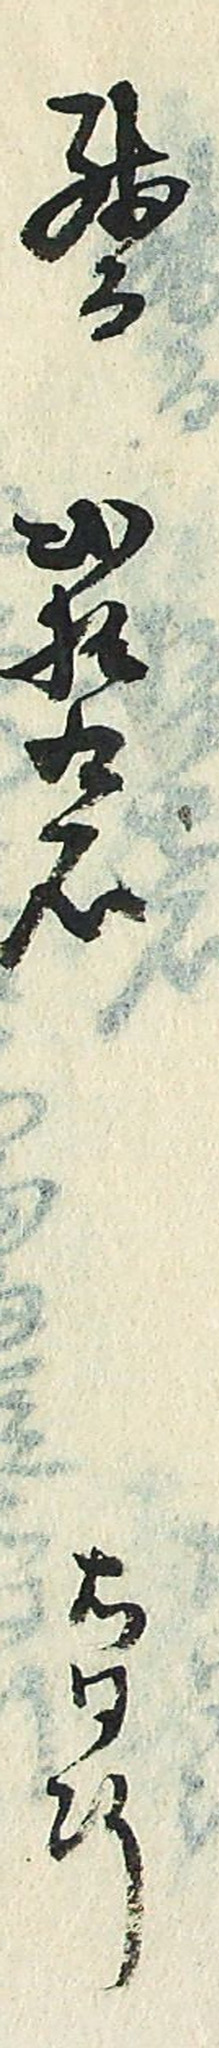残而弐拾九石右同断
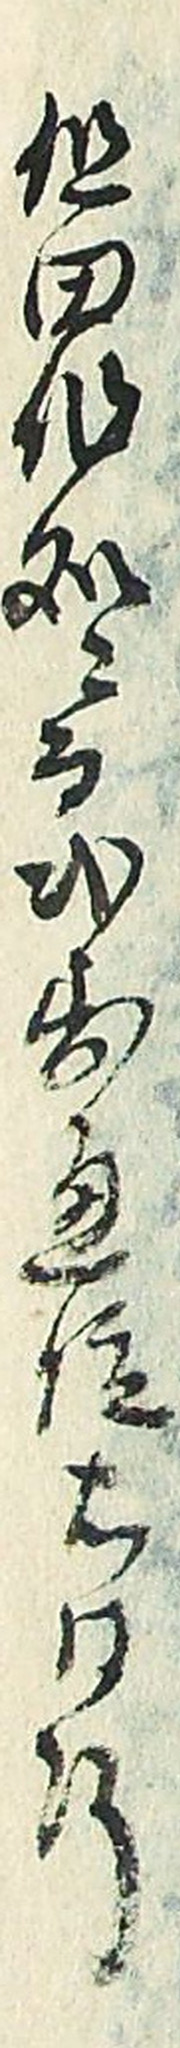但田作処ニ而弐歩通位右同断

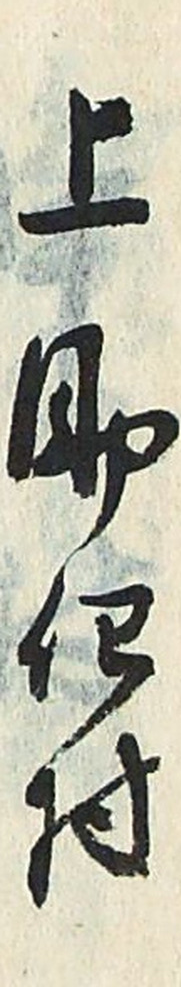上助任村
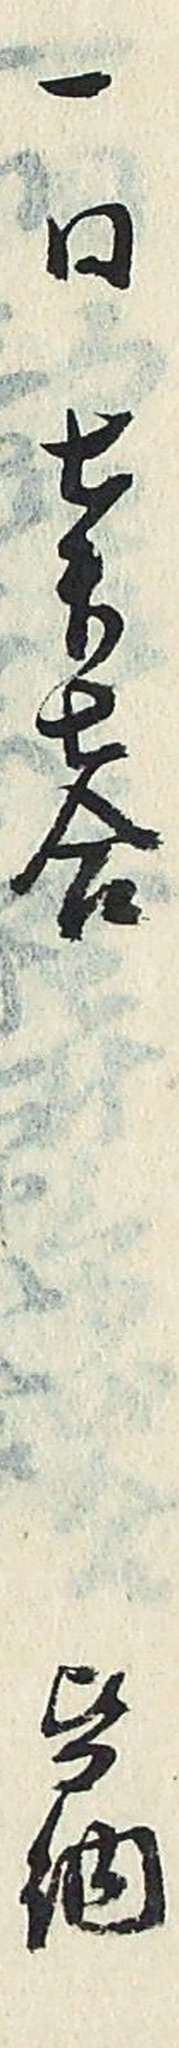一同七升七合皆納
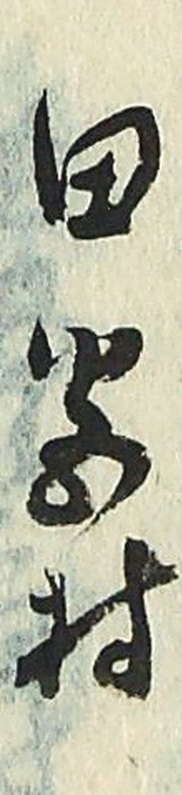田宮村
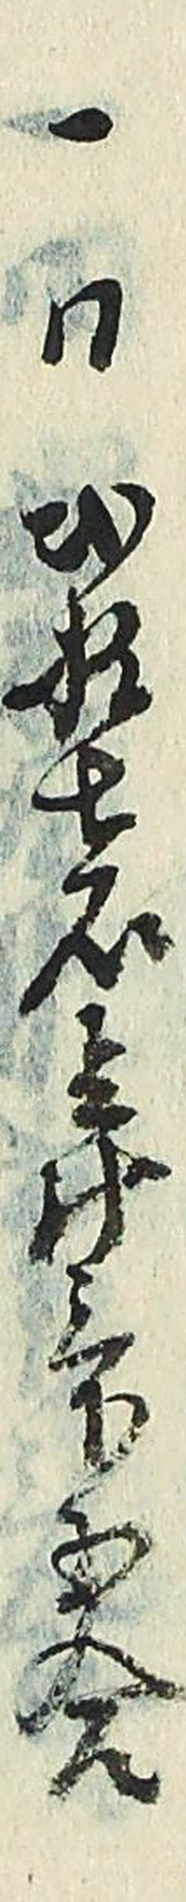一同弐拾七石壱斗三升五合
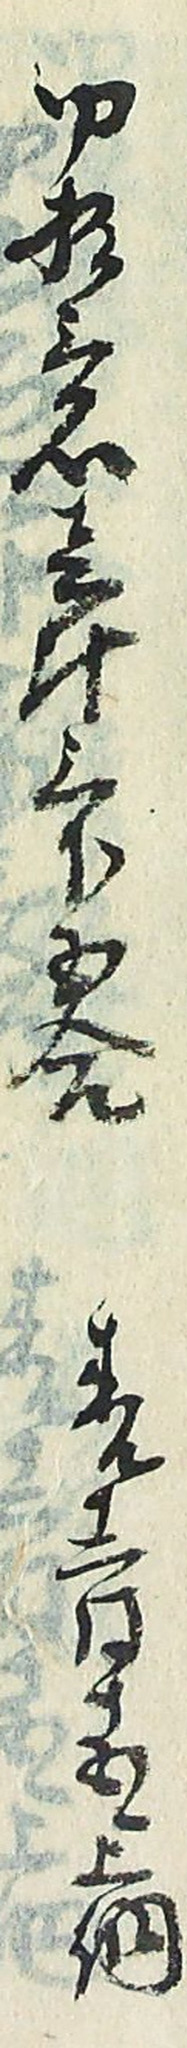内拾三石壱斗三升五合来ル十二月十五日上納
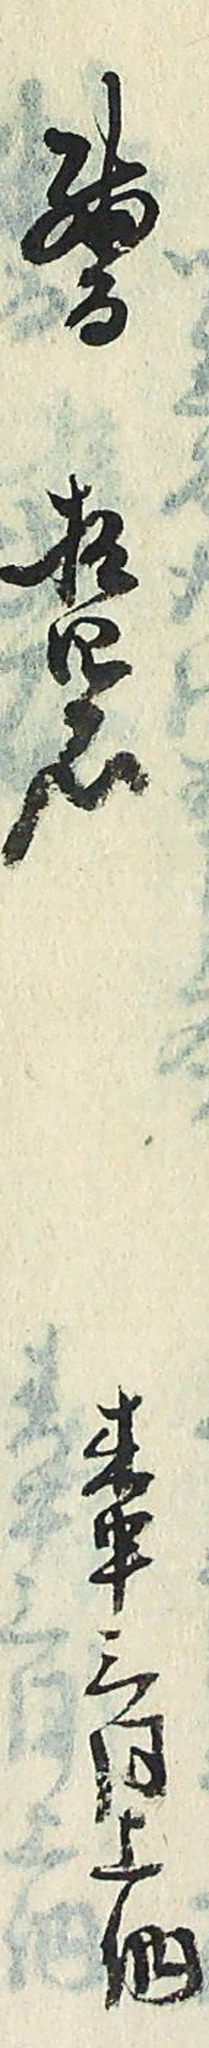残而拾四石来申三月上納
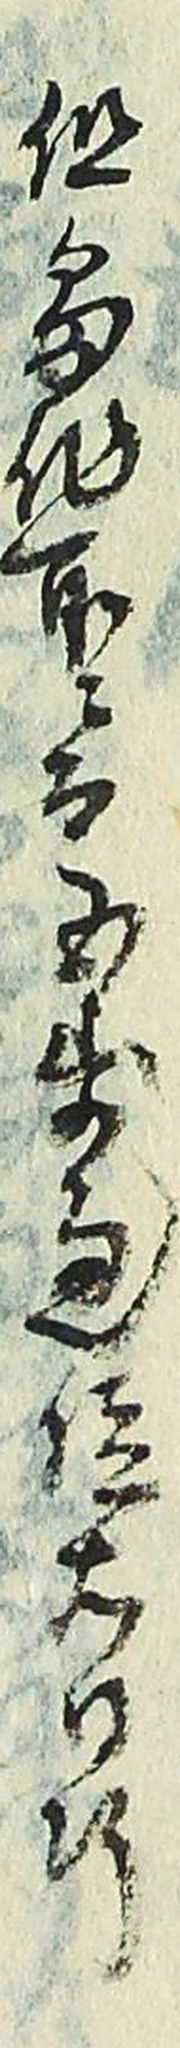但畠作所ニ而五歩通位右同断
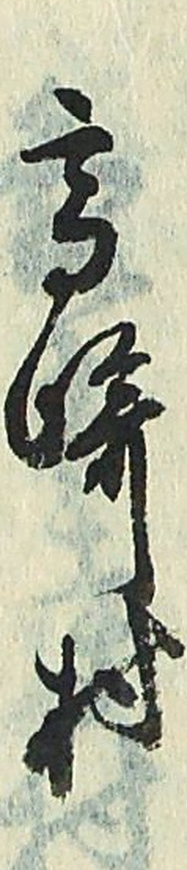高崎村
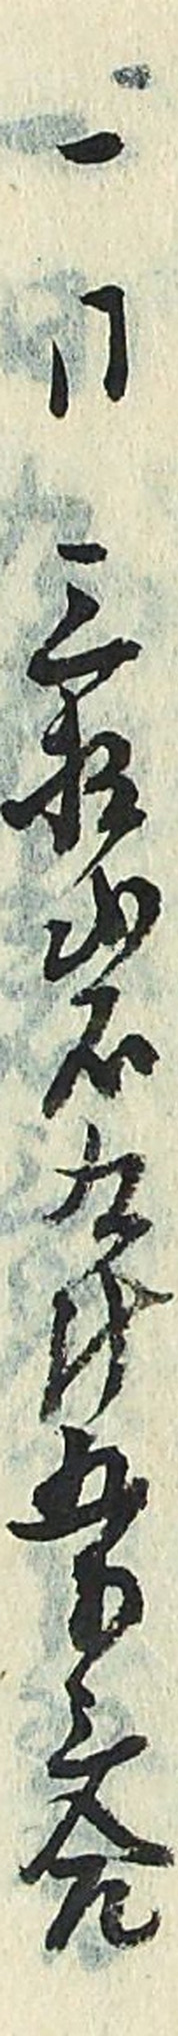一同三拾弐石九斗五升三合
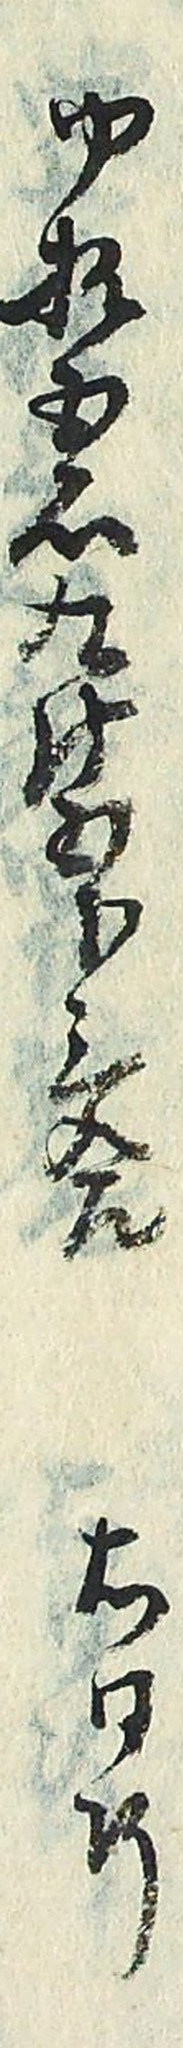内拾五石九斗五升三合右同断
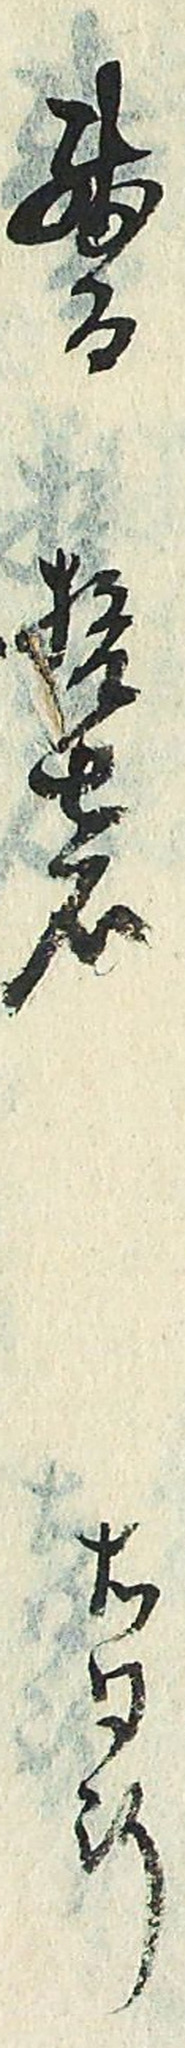残而拾七石右同断
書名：諸御趣意書并御下知向之写
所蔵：鳴門教育大学 Naruto University of Education
